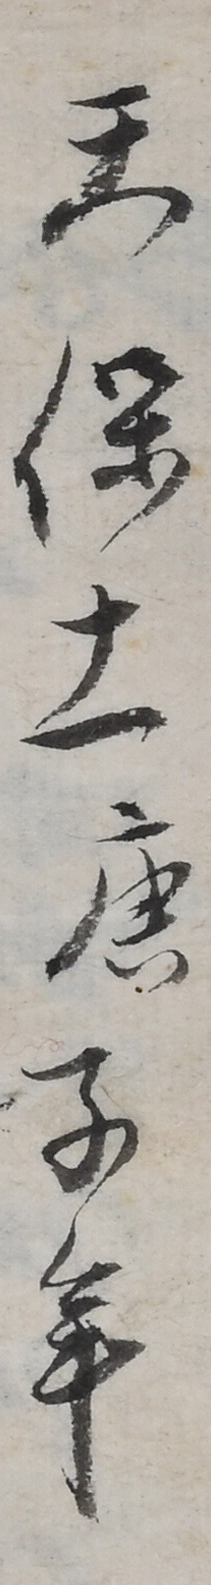天保十一庚子年
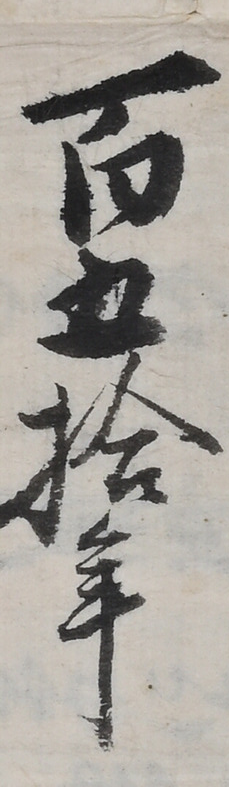百五拾年
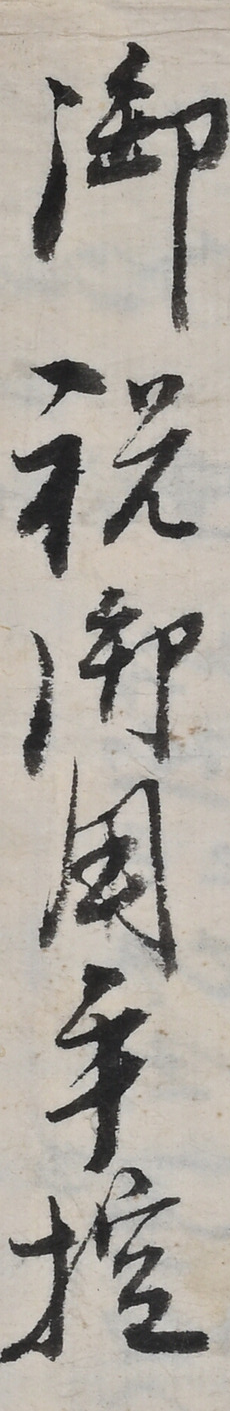御祝御用手控
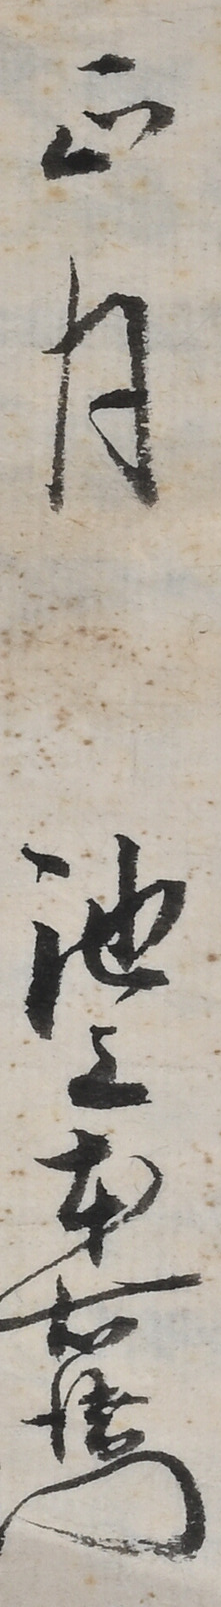正月池上本右衛門
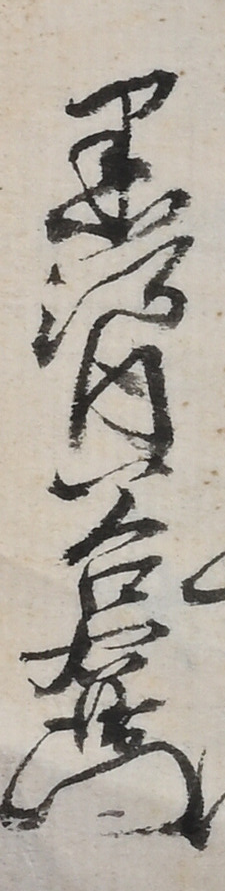黒河内谷右衛門

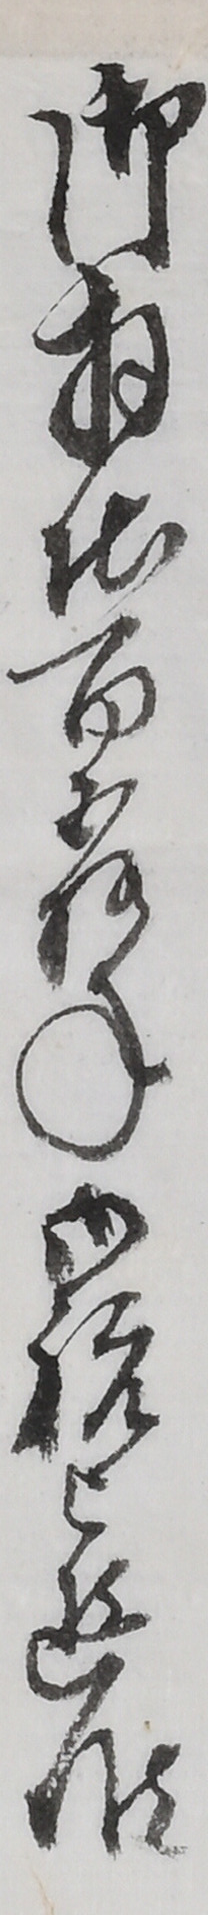御拝地百五拾年御祝被遊候
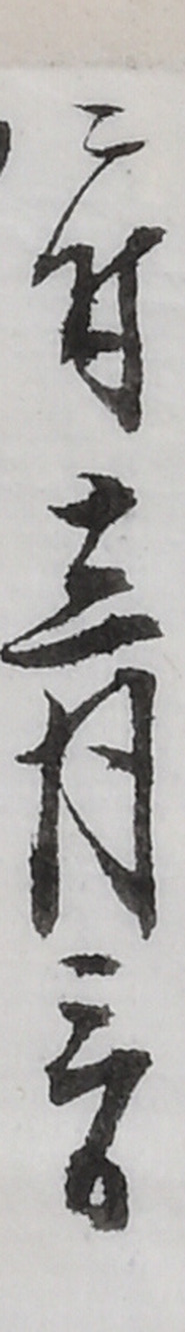ニ付十二月三日
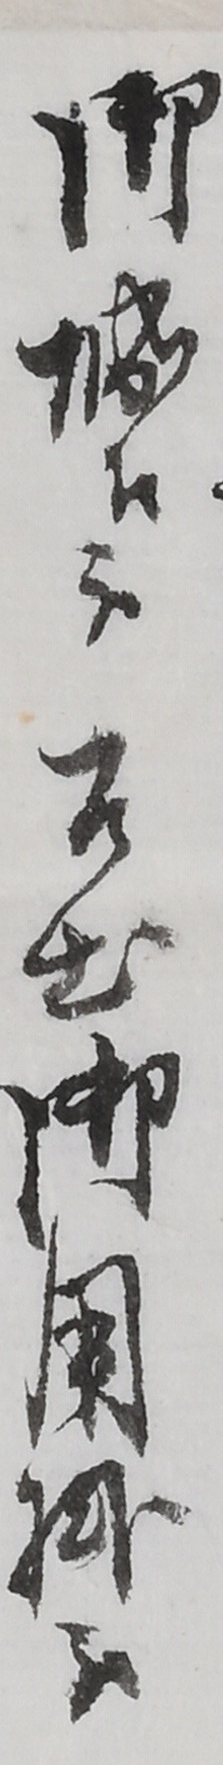御城江被召出御用掛被
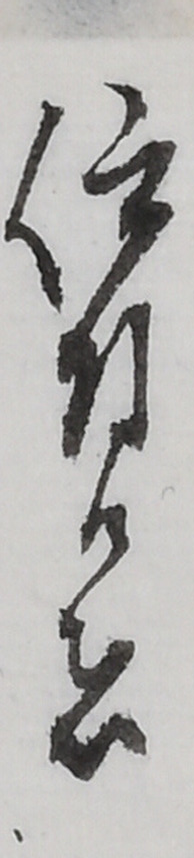仰付候者
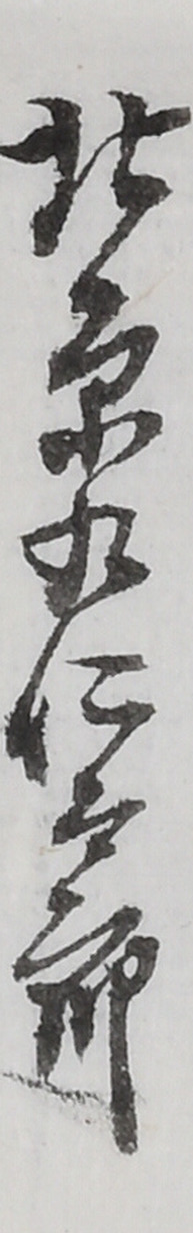北原九仁太郎
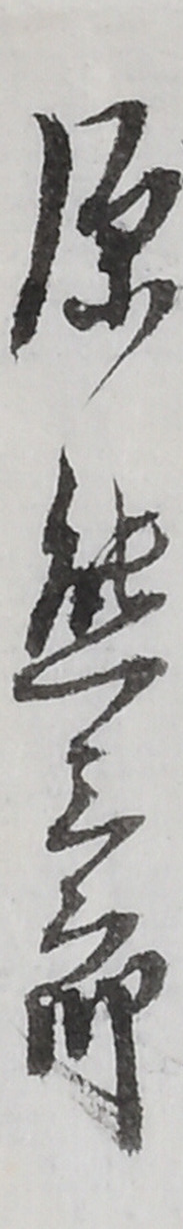原熊三郎
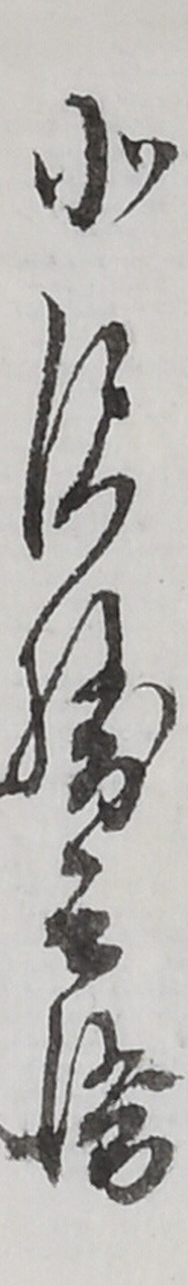北沢勝兵衛
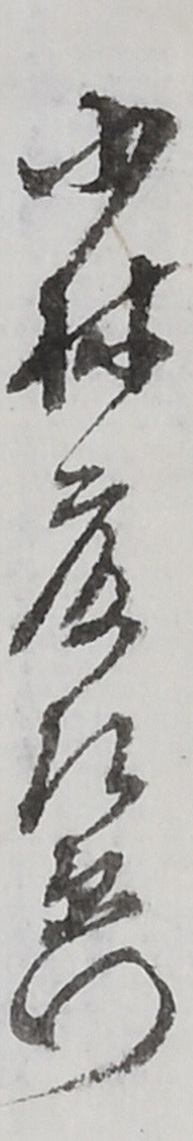小林藤左衛門
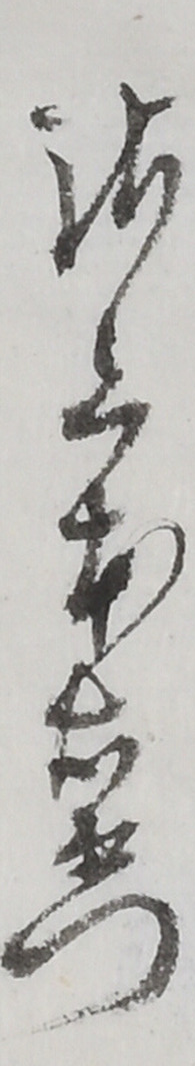池上本右衛門
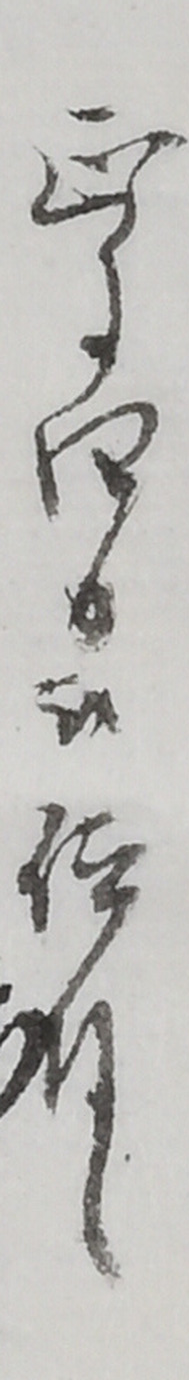正月四日被仰付候
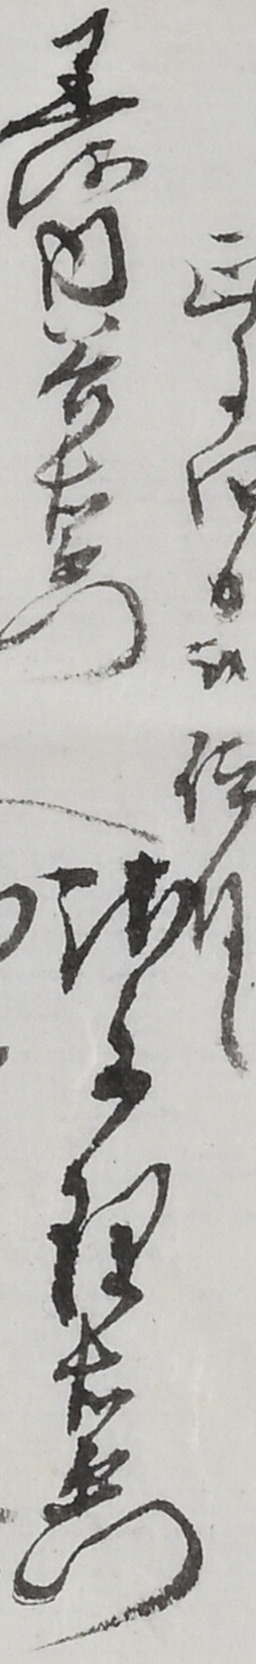黒河内谷右衛門池上理右衛門
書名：百五拾年御祝御用手控
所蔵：伊那市立高遠町図書館・合同会社AMANE
